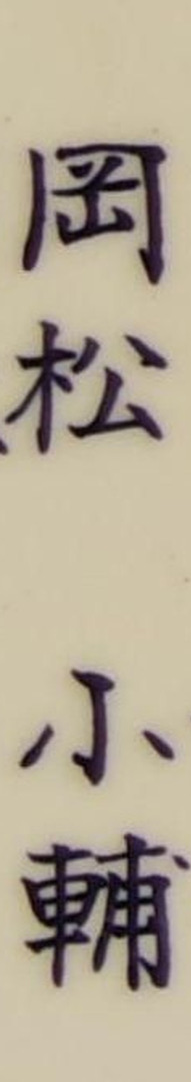岡松小輔

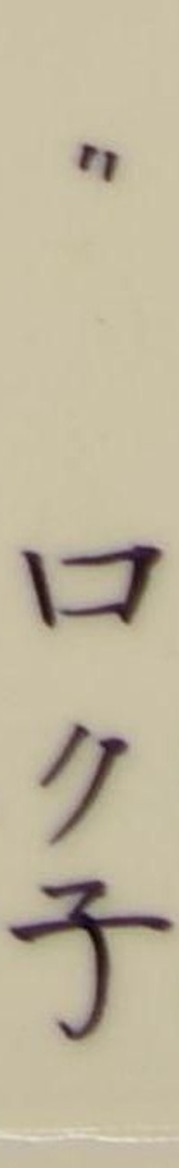ロク子
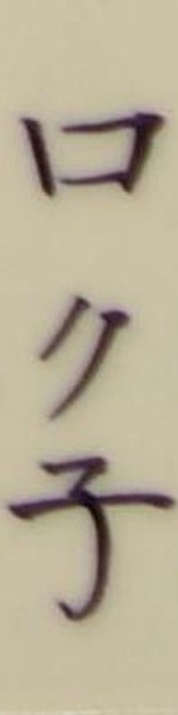ロク子
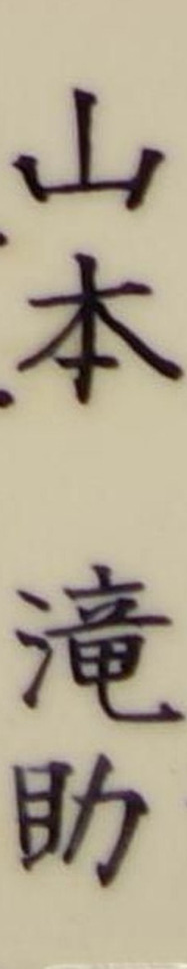山本滝助
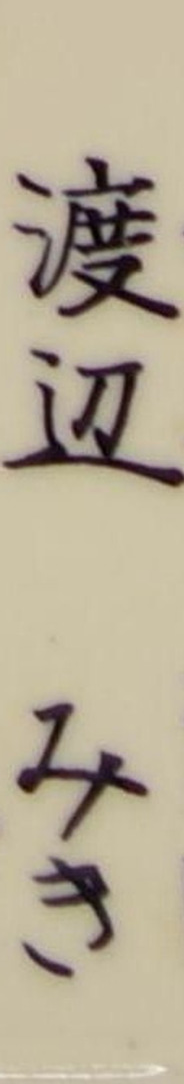渡辺みき
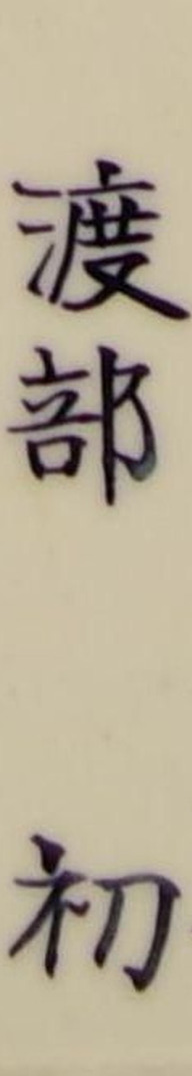渡部初
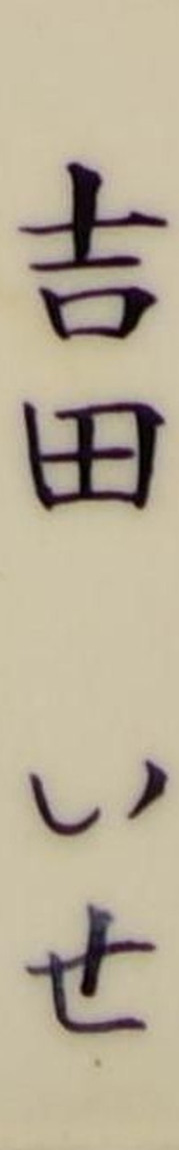吉田いせ
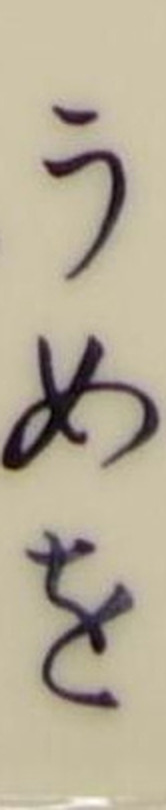うめを
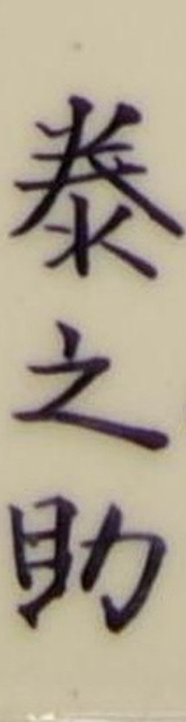泰之助
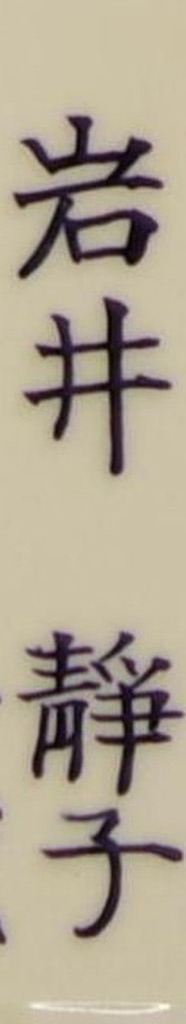岩井静子
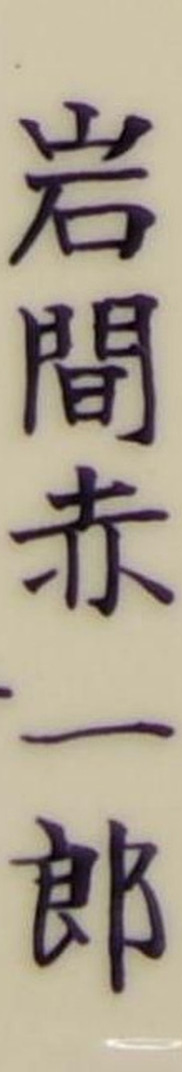岩間赤一郎
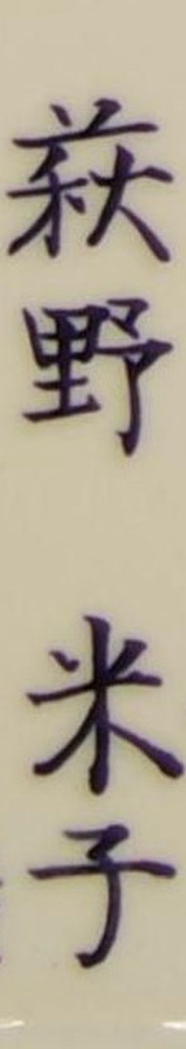萩野米子

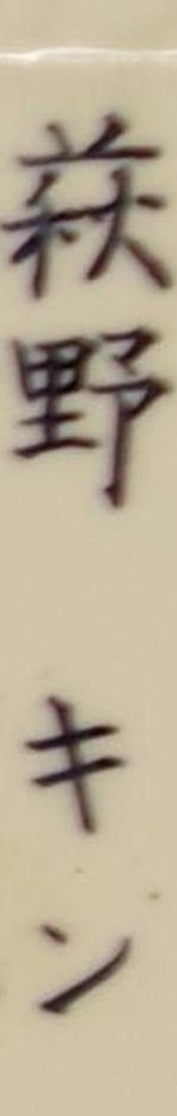萩野キン
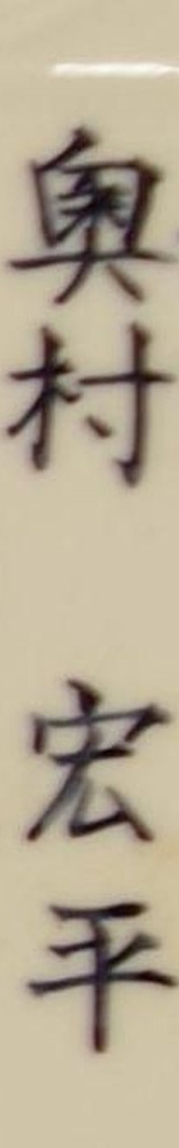奥村宏平
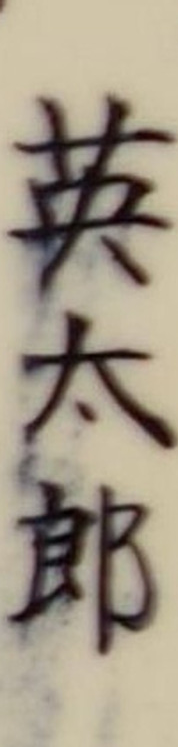英太郎
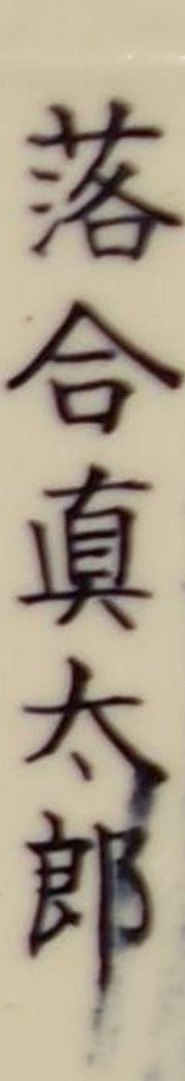落合真太郎
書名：E~L
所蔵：高野山金剛峯寺
